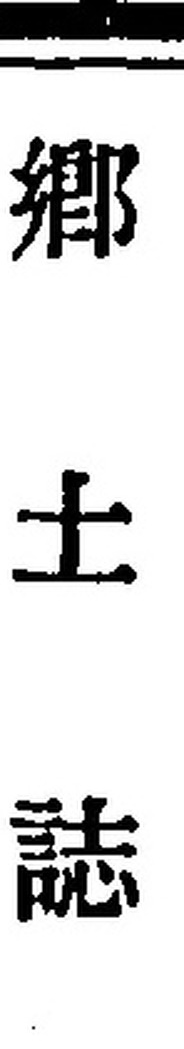郷土誌
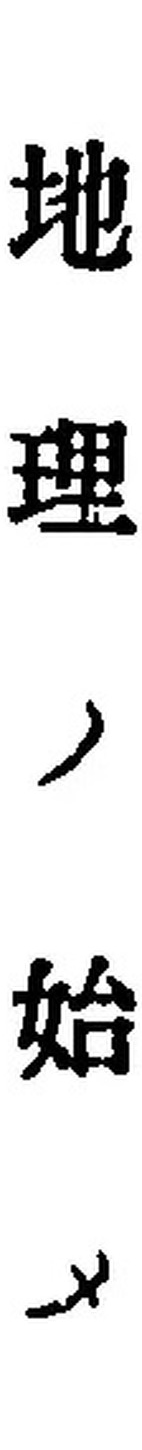地理ノ始メ
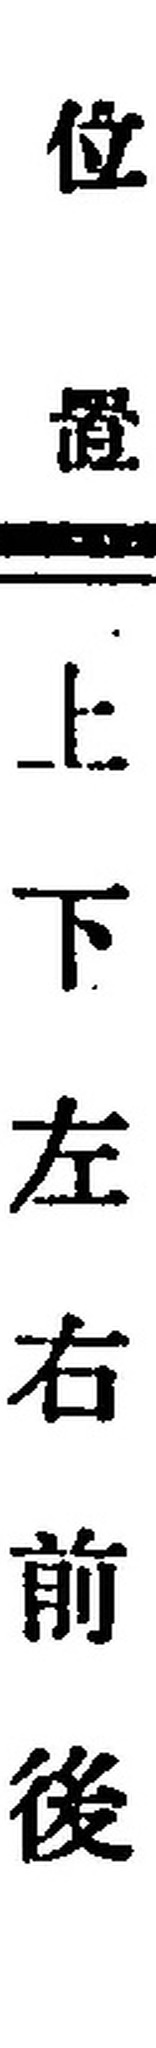位置上下左右前後
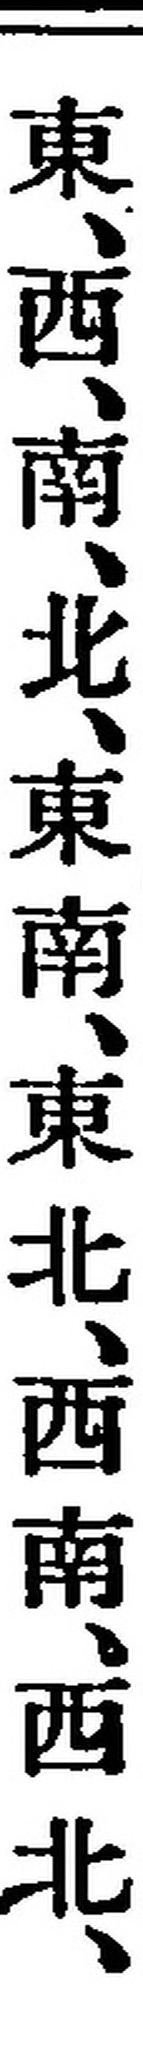方位東、西、南、北、東南、東北、西南、西北、
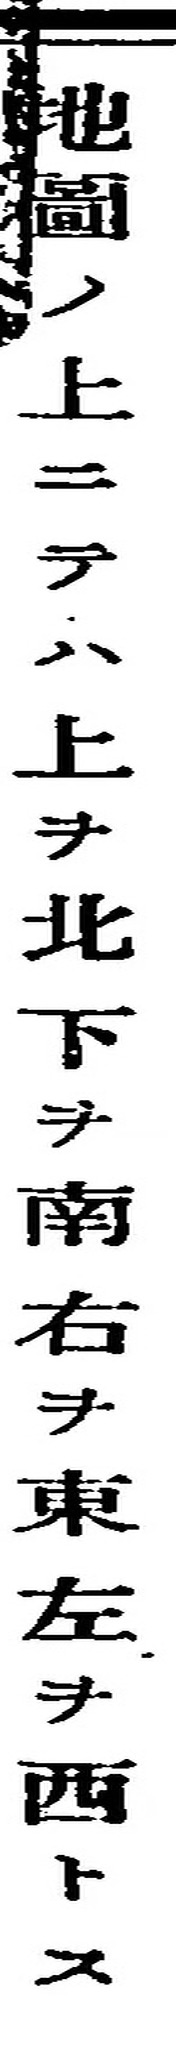地圖ノ地圖ノ上ニテハ上ヲ北下ヲ南右ヲ東左ヲ西トス
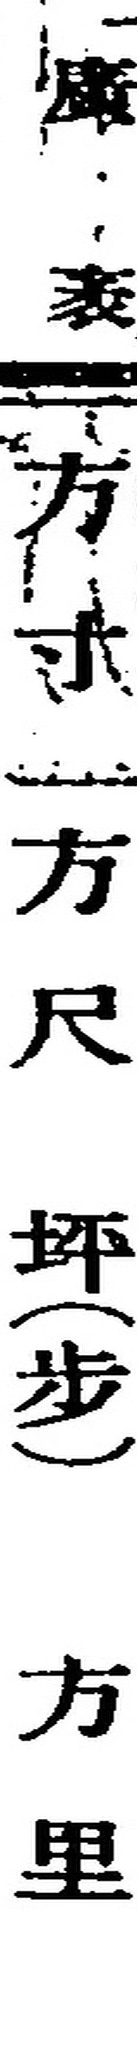廣袤方寸方尺坪(歩)方里

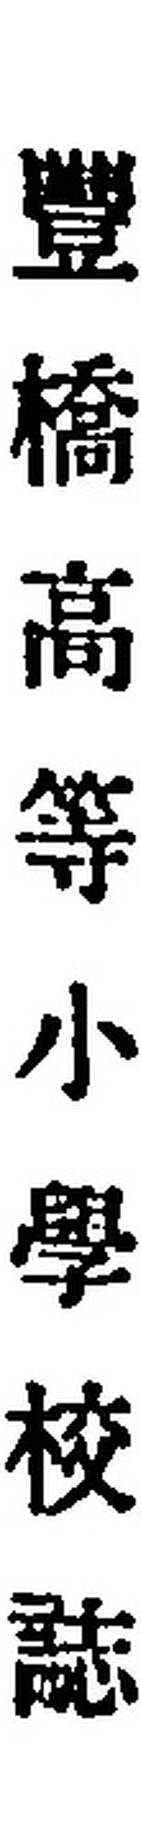豐橋高等小學校誌
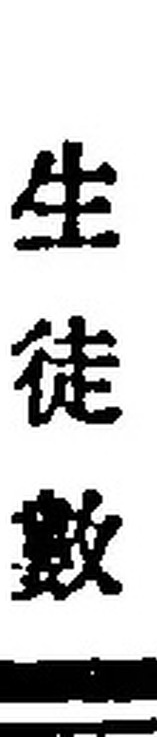生徒數
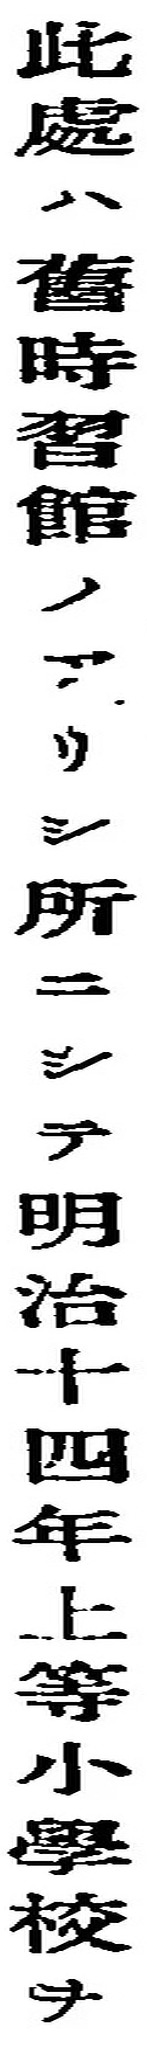沿革此處ハ舊時習館ノアリシ所ニシテ明治十四年上等小學校ヲ
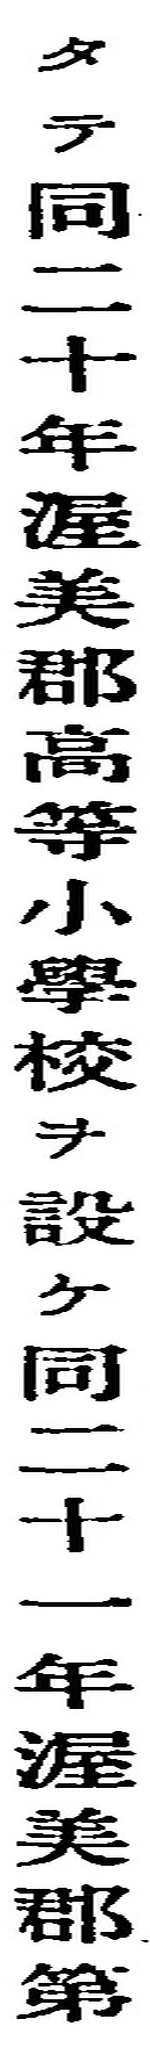タテ同二十年渥美郡高等小學校ヲ設ケ同二十一年渥美郡第
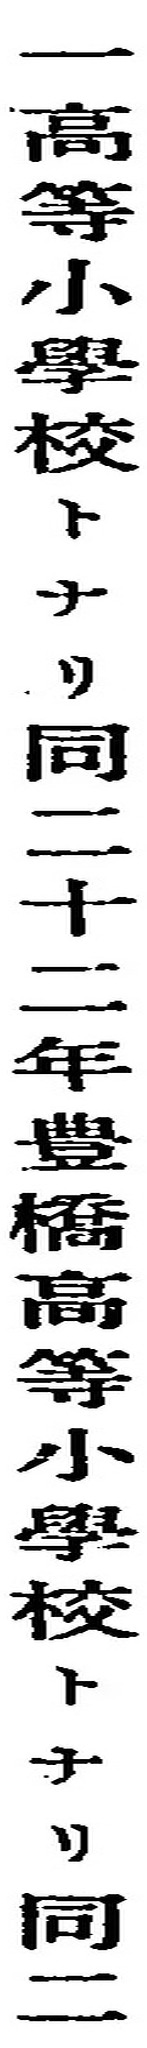一高等小學校トナリ同二十二年豊橋高等小學校トナリ同二
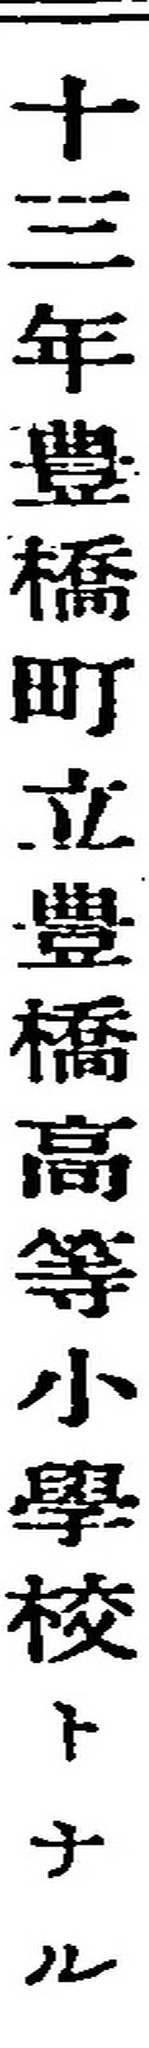十三年豊橋町立高等小學校トナル
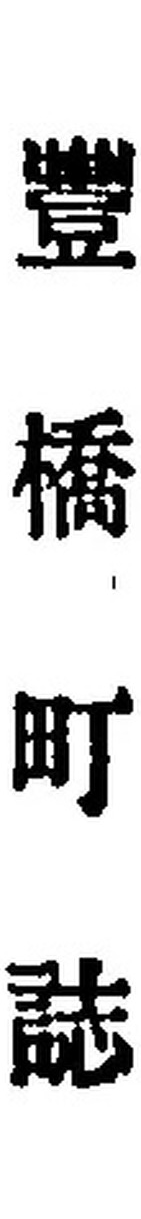豐橋町誌
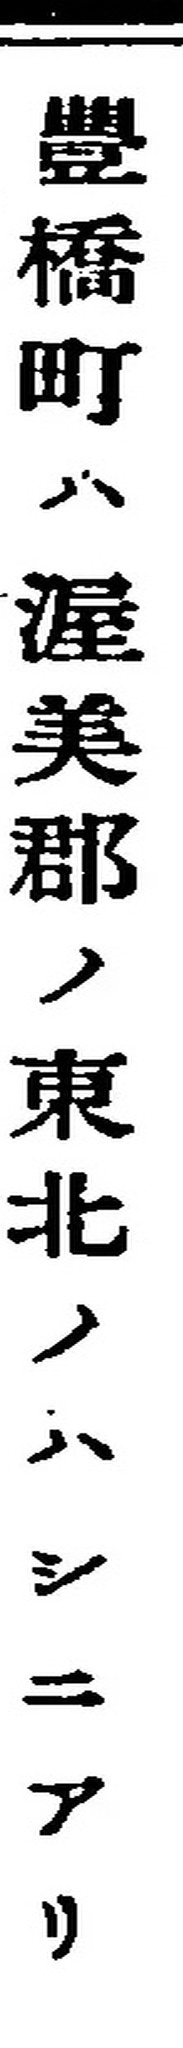位置豐橋町ハ渥美郡ノ東北ノハシニアリ
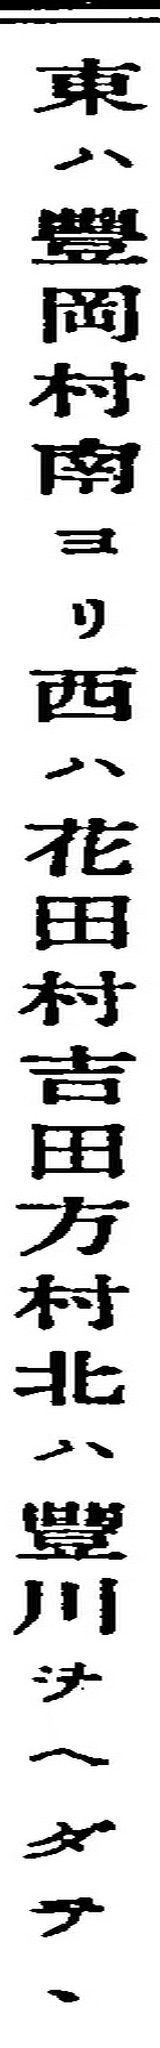境界東ハ豐岡村南ヨリ西ハ花田村吉田方村北ハ豐川ヲヘダテヽ
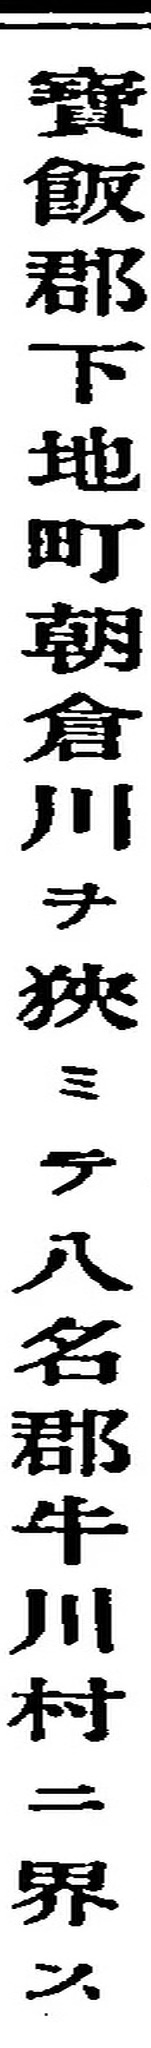寶飯郡下地町朝倉川ヲ共狹ミテ八名郡牛川村ニ界ス
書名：郷土誌
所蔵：国立国会図書館 National Diet Library, JAPAN
